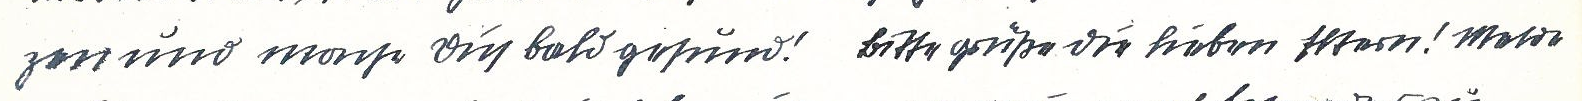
zen und mache Dich bald gesund! Bitte grüße die lieben Eltern! Melde
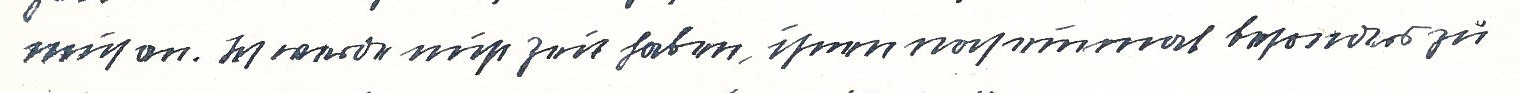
mich an. Ich werde nicht Zeit haben, ihnen noch einmal besonders zu
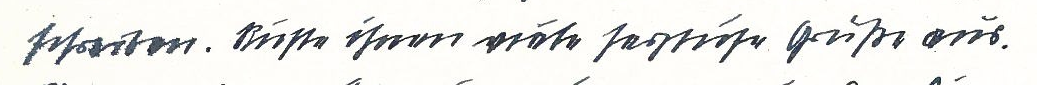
schreiben. Richte ihnen viele herzliche Grüße aus.
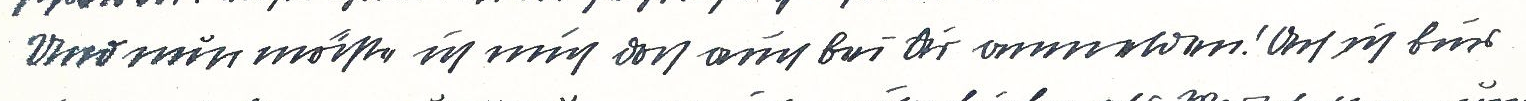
Und nun möchte ich mich doch auch bei Dir anmelden! Ach ich bins
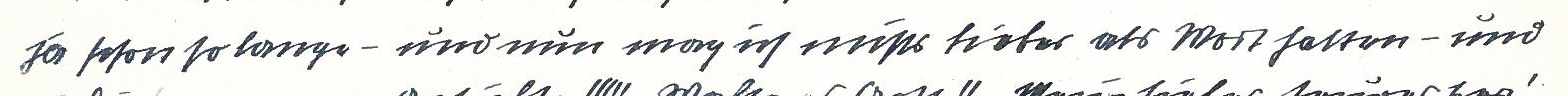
ja schon so lange – und nun mag ich nichts lieber als Wort halten – und
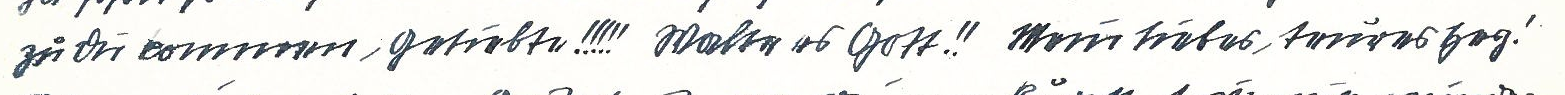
zu Dir kommen, Geliebte!!!!! Walte es Gott!! Mein liebes, teures Herz!
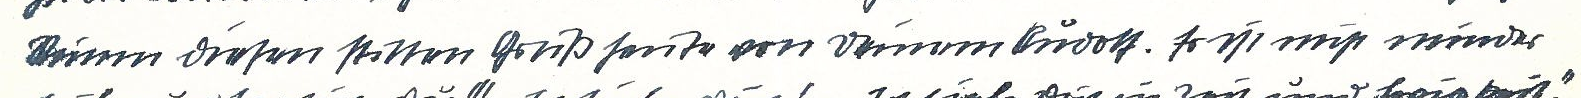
Nimm diesen stillen Gruß heute von Deinem Rudolf. Er ist nicht minder
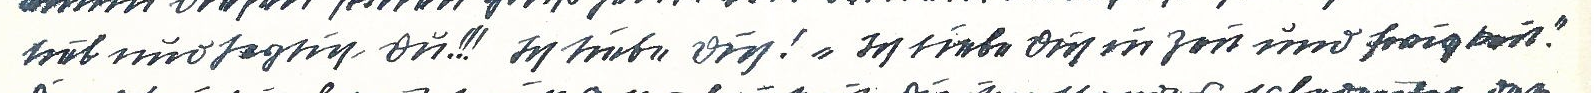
lieb und herzlich, Du!!! Ich liebe Dich! „Ich liebe Dich in Zeit und Ewigkeit.”
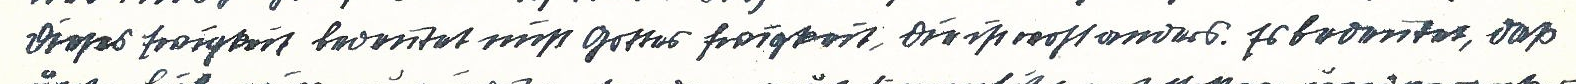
Diese Ewigkeit bedeutet nicht Gottes Ewigkeit, die ist recht anders. Es bedeutet, daß
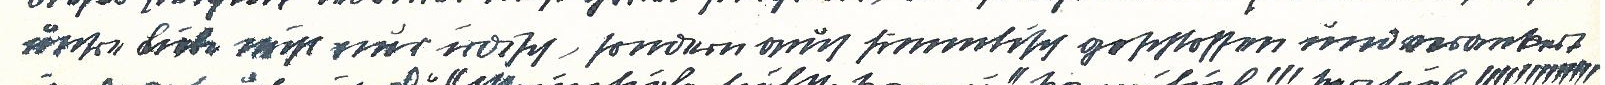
unsre Liebe nicht nur irdisch, sondern auch himmlisch geschlossen und verankert
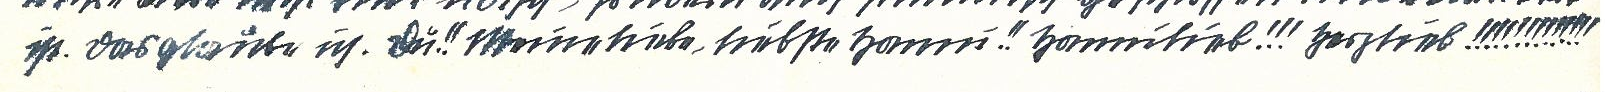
ist. Das glaube ich. Du!! Meine liebe, liebste !! lieb!!! Herzlieb!!!!!!!!!!!!!
